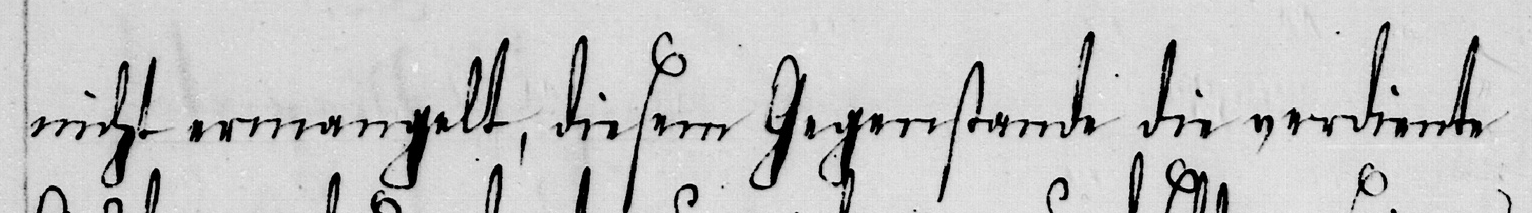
nicht ermangelt, diesem Gegenstande die verdiente
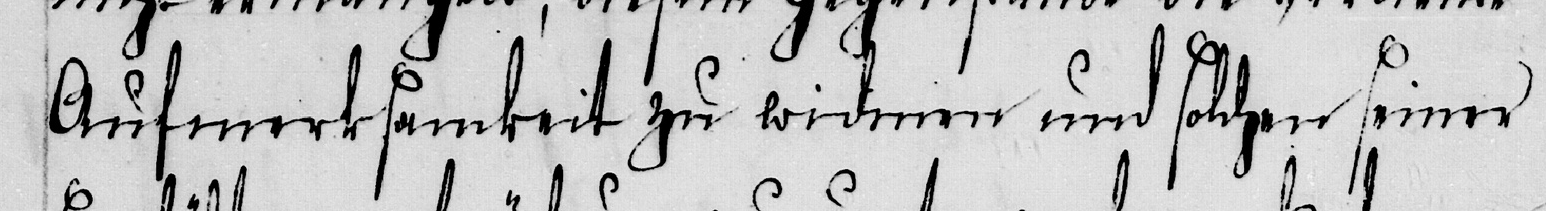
Aufmerksamkeit zu widmen und solchen seiner
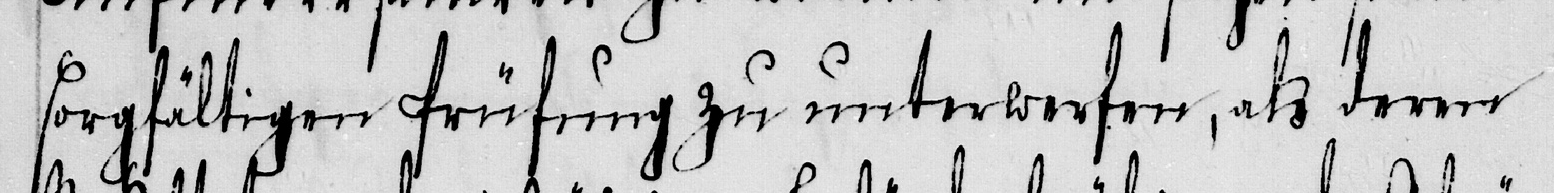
sorgfältigen Prüfung zu unterwerfen, als deren
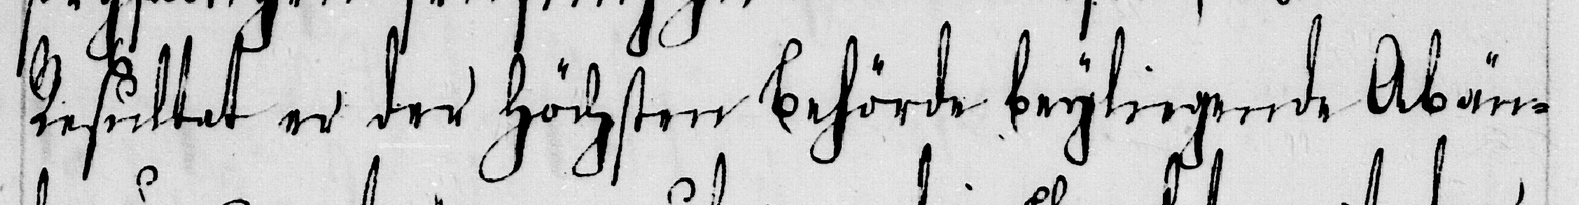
Resultat er der höchsten Behörde beyliegende Abän¬
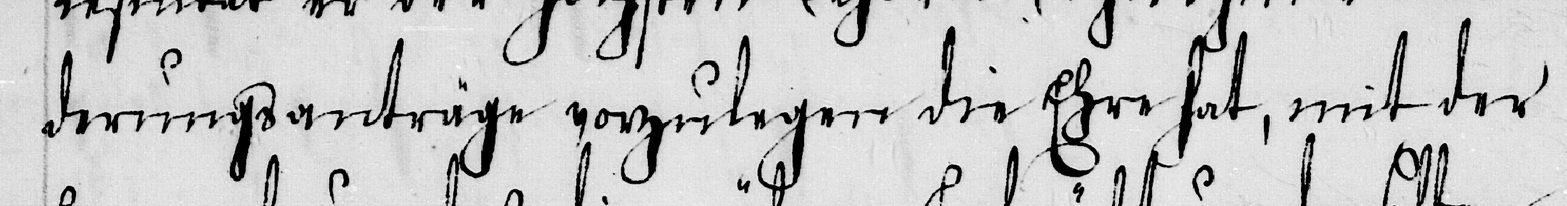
derungsanträge vorzulegen die Ehre hat, mit der
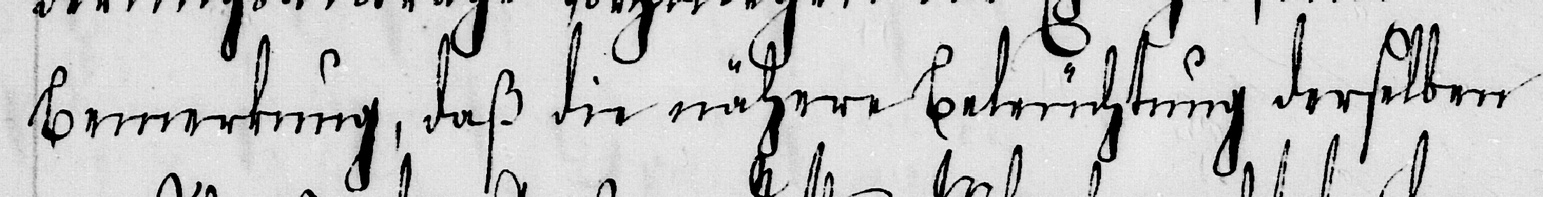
Bemerkung, daß die nähere Beleuchtung derselben
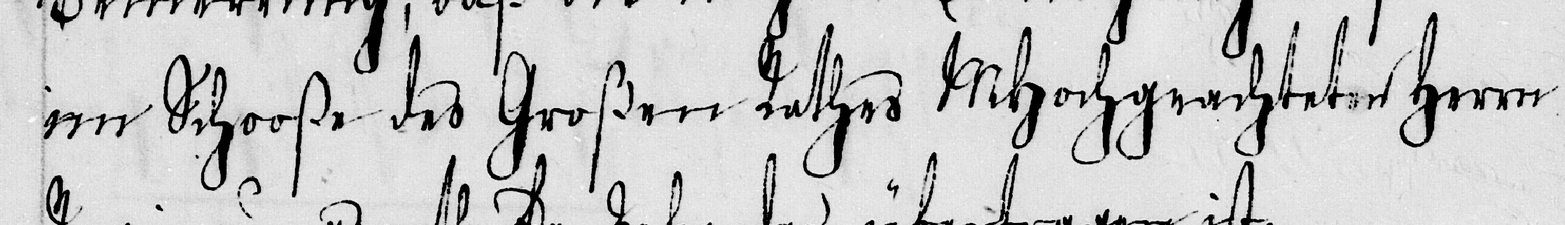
im Schooße des Großen Rathes MHochgeachteten Herrn
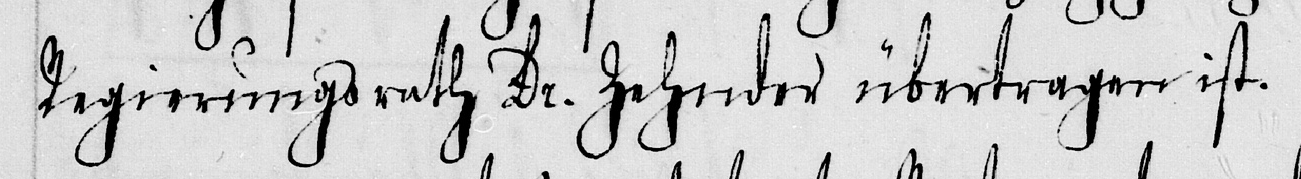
Regierungsrath Dr. Zehnder übertragen ist.
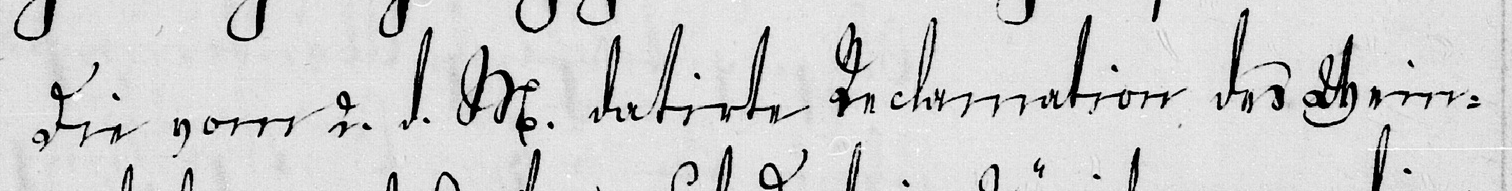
Die vom 2. d. M. datirte Reclamation des Wein¬
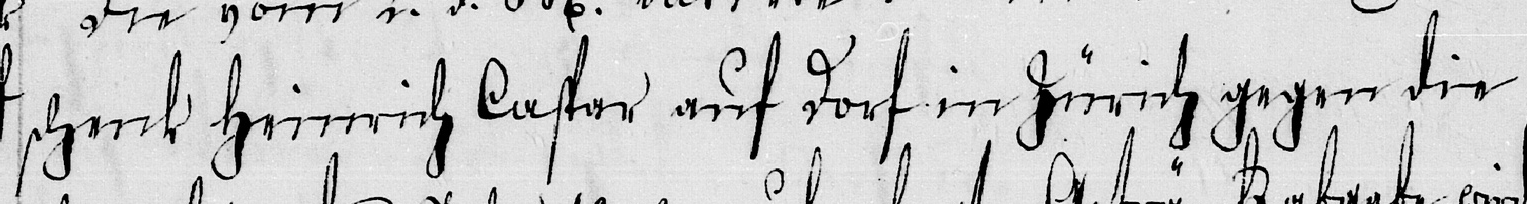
schenk Heinrich Caspar auf Dorf in Zürich gegen die
